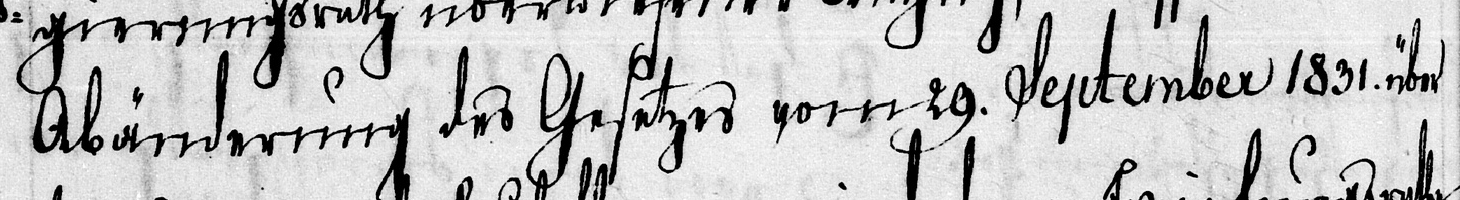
Abänderung des Gesetzes vom 29. September 1831. üb¬
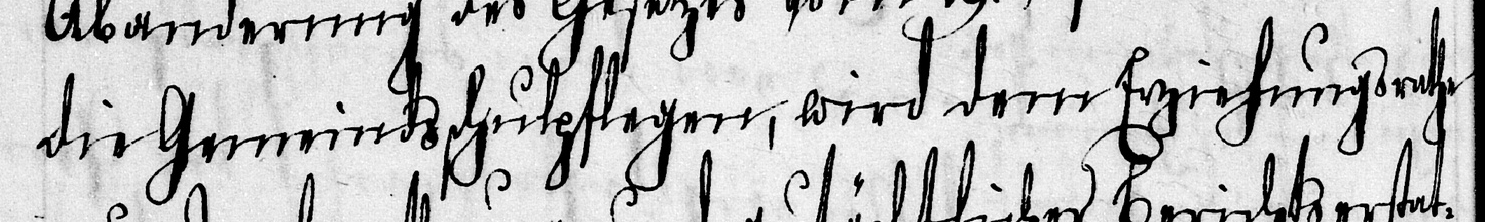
die Gemeindsschulpflegen, wird dem Erziehungsrat¬
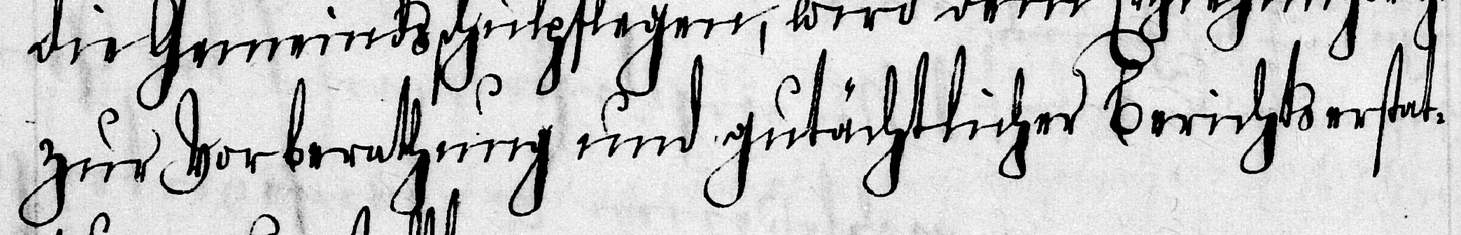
zur Vorberathung und gutächtlicher Berichtsersta¬
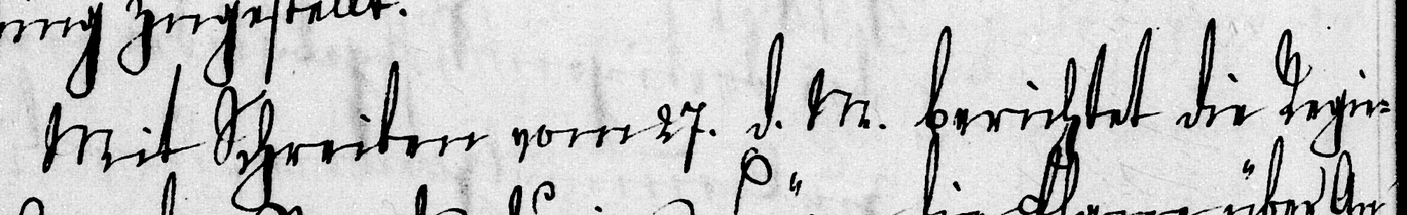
Mit Schreiben vom 27. d. M. berichtet die Regie¬
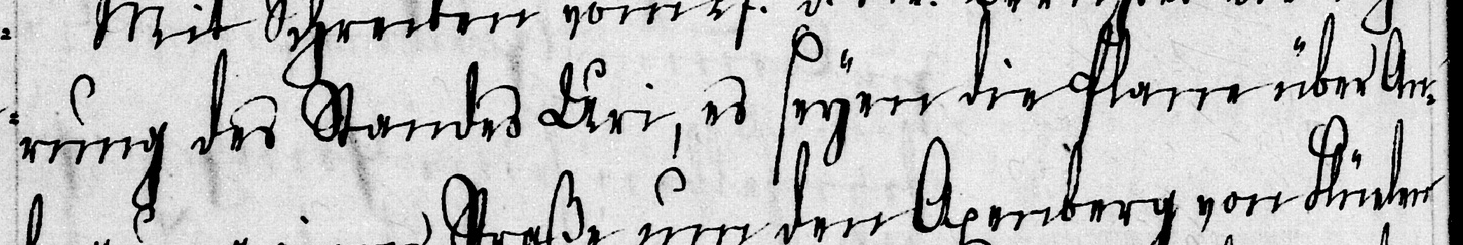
rung des Standes Uri, es seyen die Plane über An¬
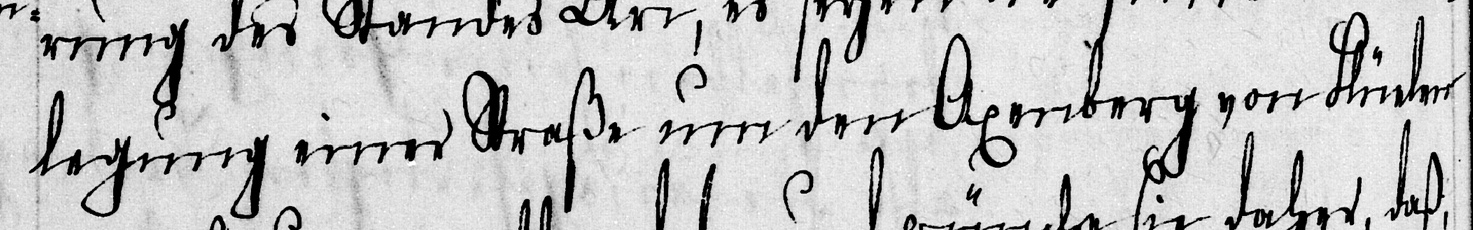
legung einer Straße um den Axenberg von Flüelen
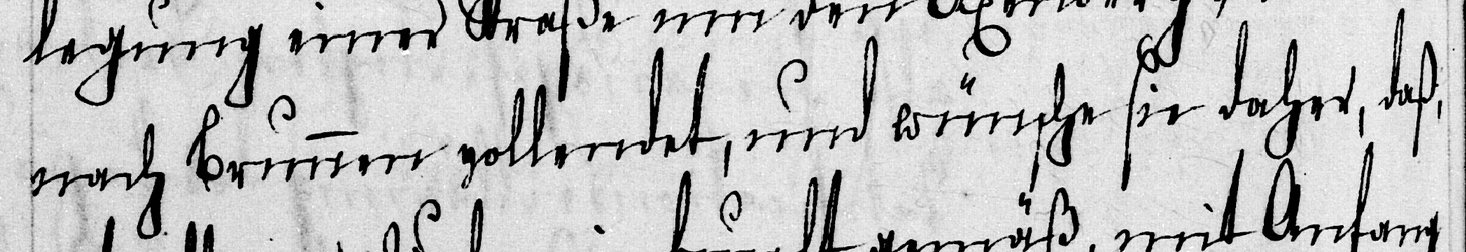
nach Brunnen vollendet, und wünsche sie daher, da¬
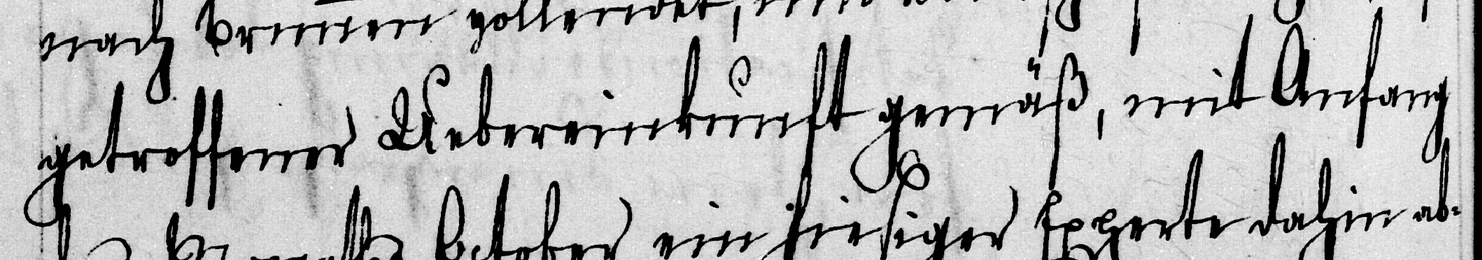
getroffener Uebereinkunft gemäß, mit Anfang
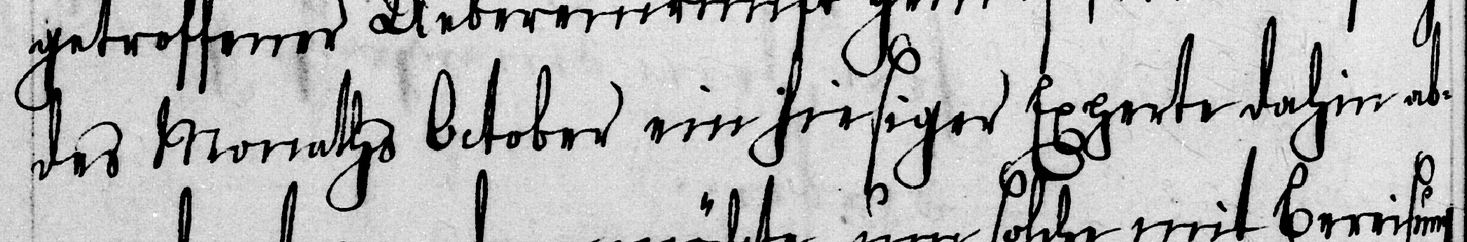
des Monaths October ein hiesiger Experte dahin ab¬
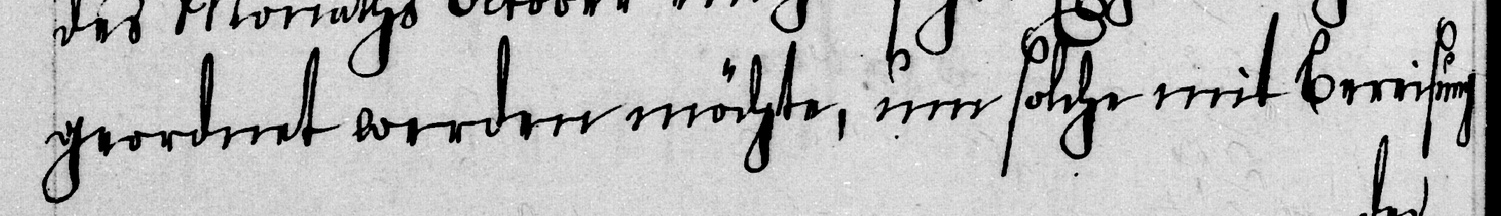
geordnet werden möchte, um solche mit Bereisung
